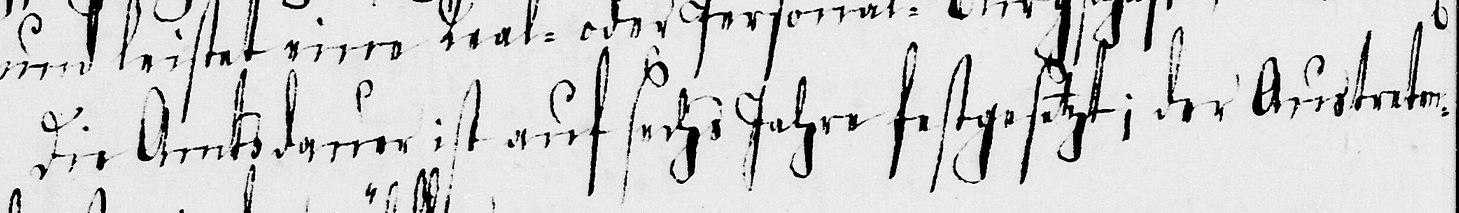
Die Amtsdauer ist auf sechs Jahre festgesetzt; der Austrete¬
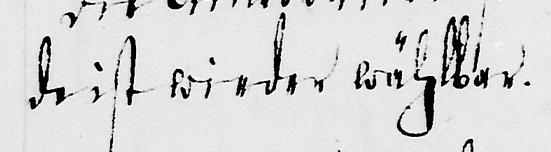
nde ist wieder wählbar.
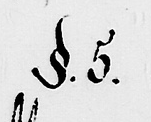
§. 5.
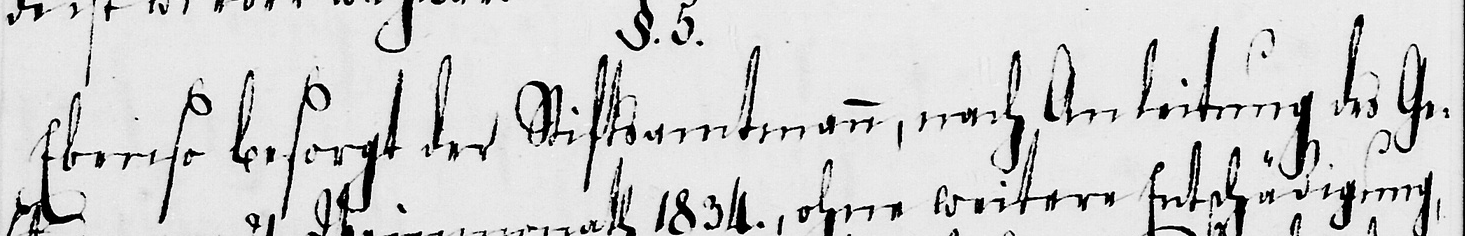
Ebenso besorgt der Stiftsamtmann, nach Anleitung des G¬
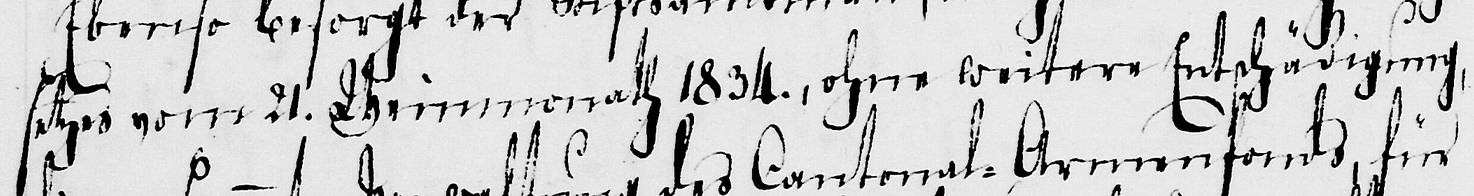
setzes vom 21. Weinmonath 1834., ohne weitere Entschädigung,
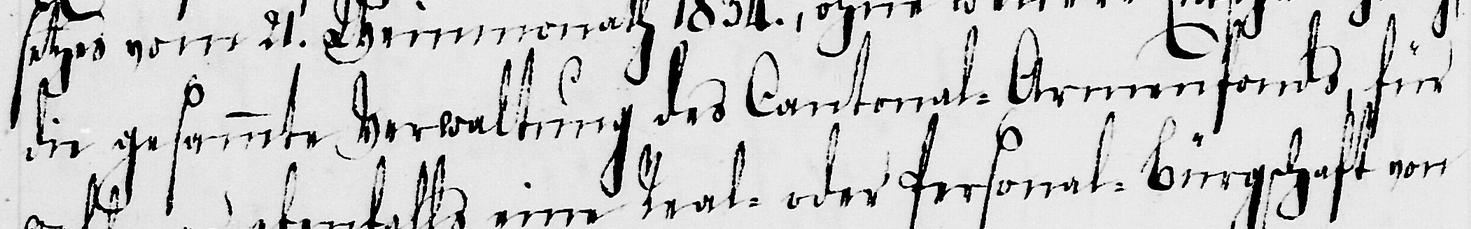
die gesammte Verwaltung des Cantonal-Armenfonds, für
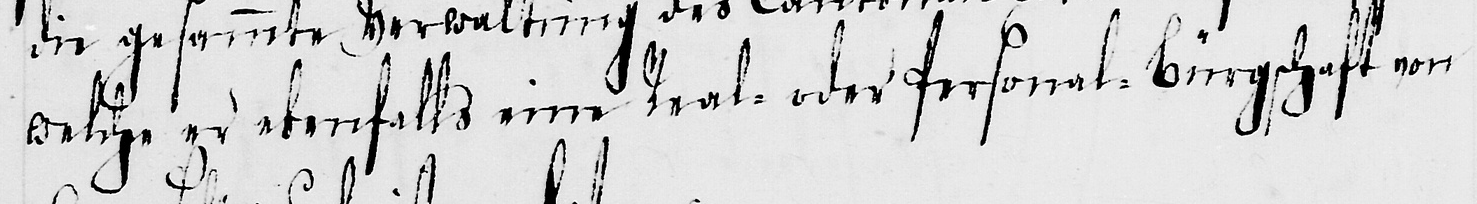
welche er ebenfalls eine Real- oder Personal-Bürgschaft von
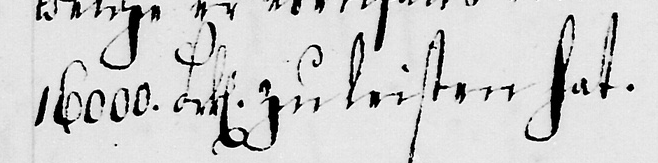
16000. Frk[en]. zu leisten hat.
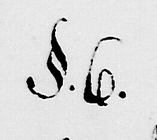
§. 6.
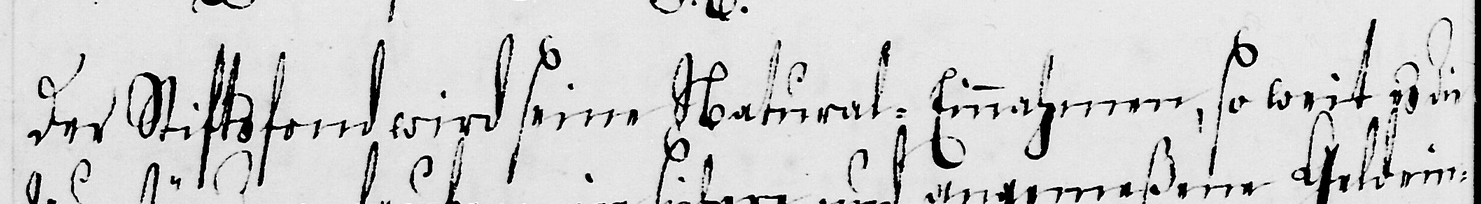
Der Stiftsfond wird seine Natural-Einnahmen, so weit es
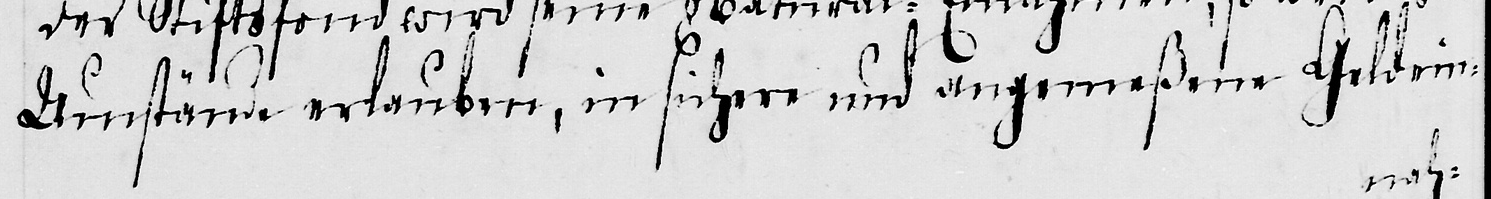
Umstände erlauben, in sichere und angemessene Geldein-
